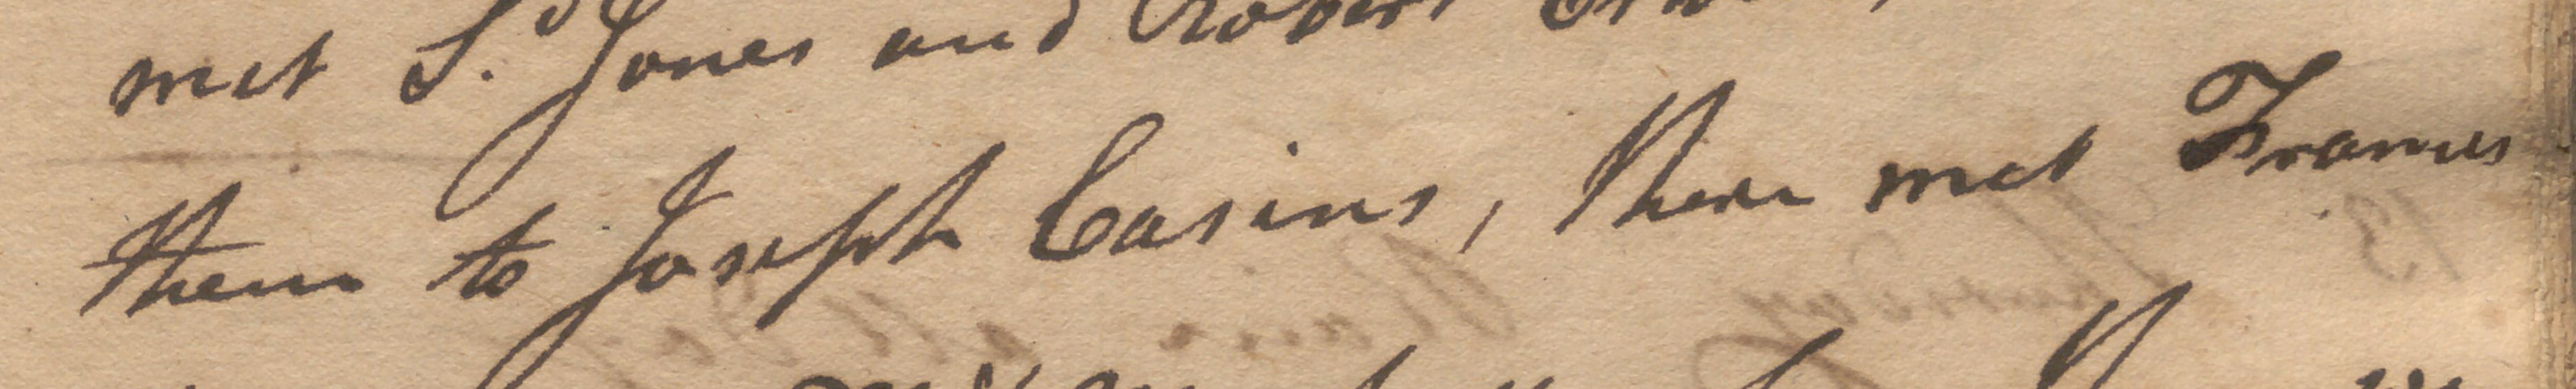them to Joseph Casins, there met Frances
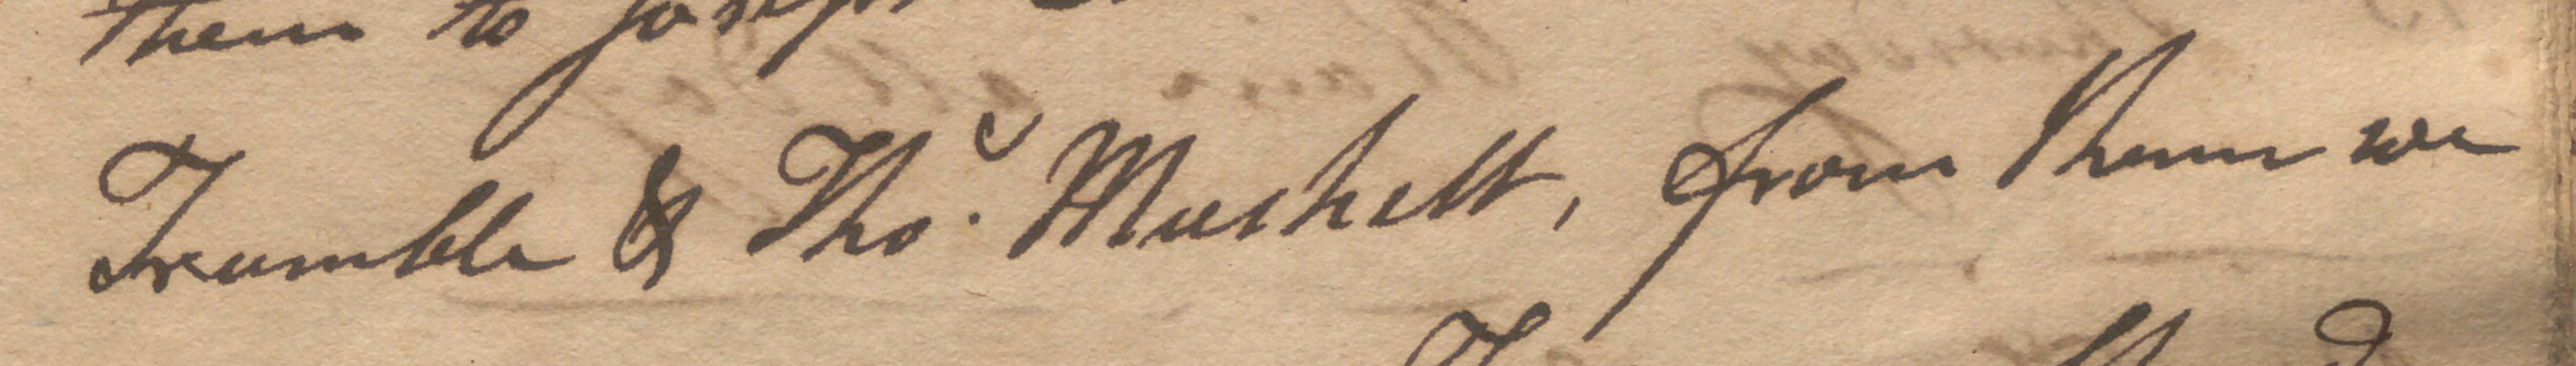Trumble & Tho^s Mushelt, from thence we
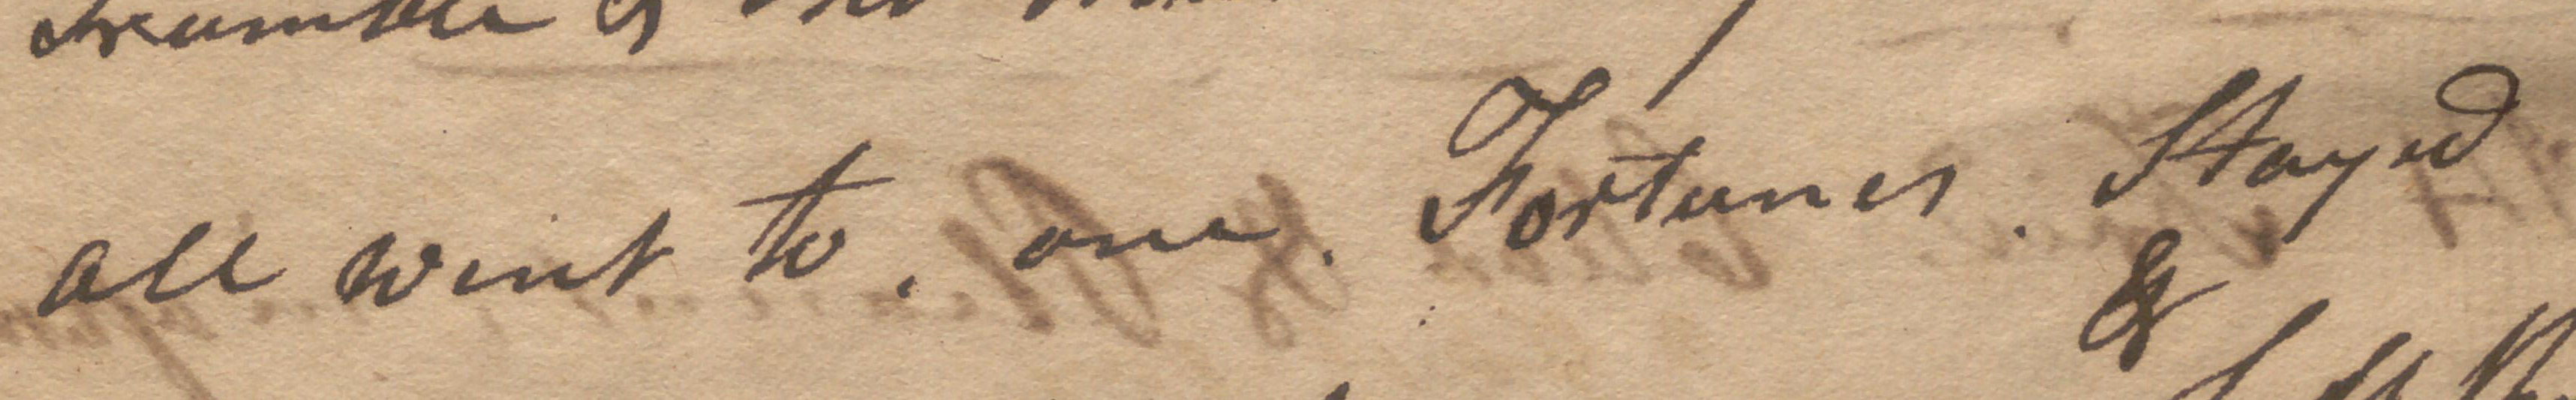all went to one Fortunes Stayed
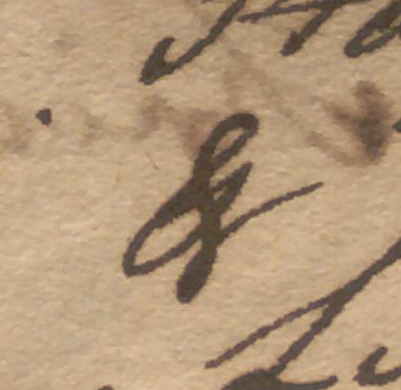&
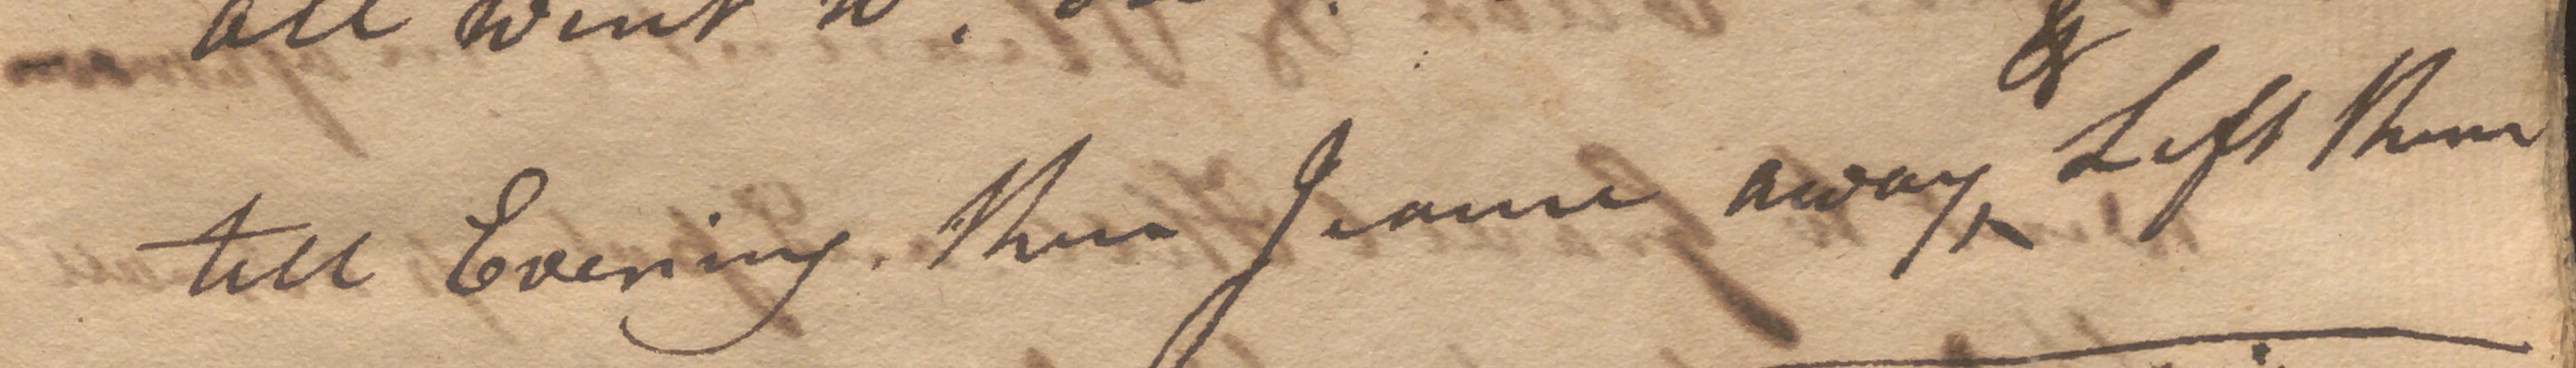till Evening then I came away ^ Left them
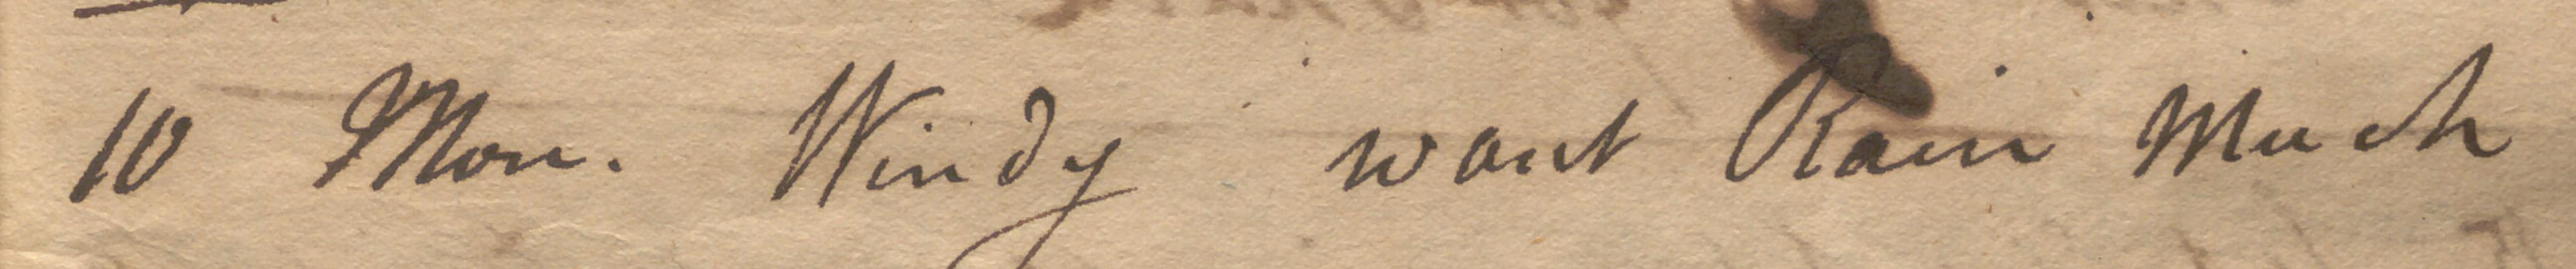10 Mon. Windy want Rain Much
